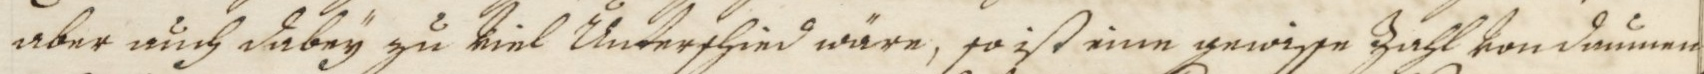aber auch dabey zu viel Unterschied wäre, so ist eine gewisse Zahl von daumen
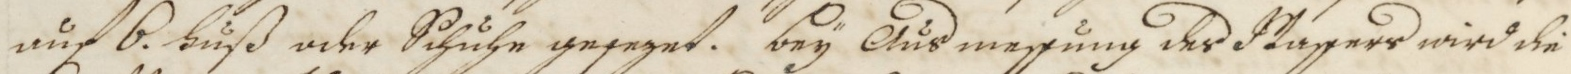auf 6. Fuß oder Schuhe gesezet. Bey Ausmessung des Wassers wird die
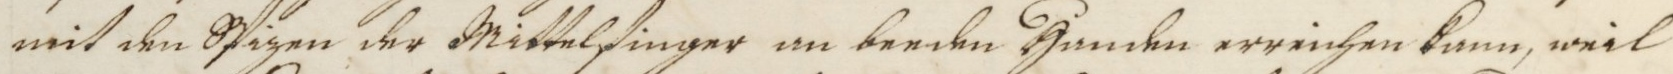mit den Spizen der Mittelfinger an beeden Handen erreichen kann, weil
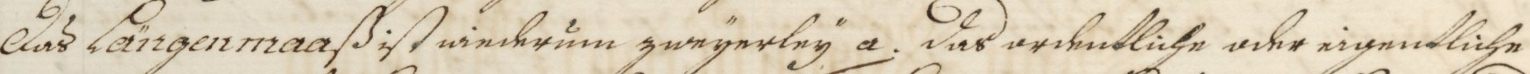Das Längenmaaß ist wiederum zweyerley a. das ordentliche oder eigentliche
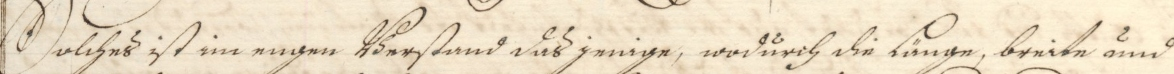Solches ist im engen Verstand das jenige, wodurch die Länge, breite und
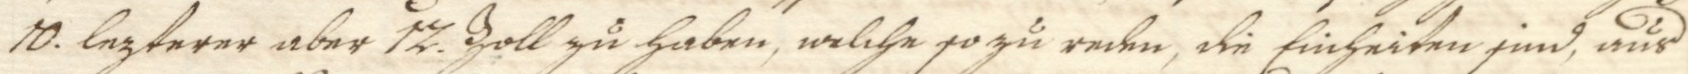10. lezterer aber 12. Zoll zu haben, welche so zu reden, die Einheiten sind, aus
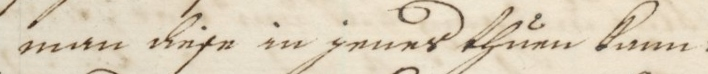man diese in jenes thuen kann.
